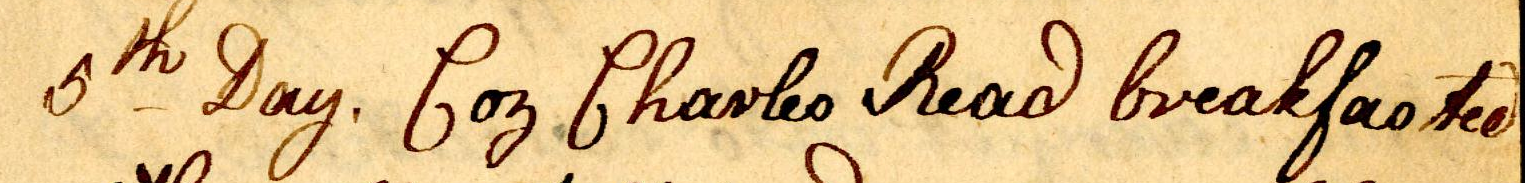5^th Day. Coz Charles Read breakfasted
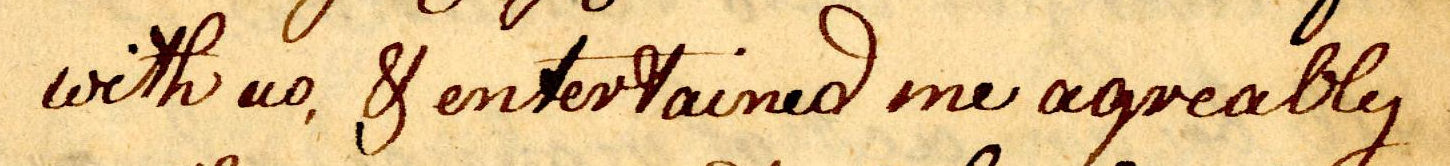with us, & entertained me agreably
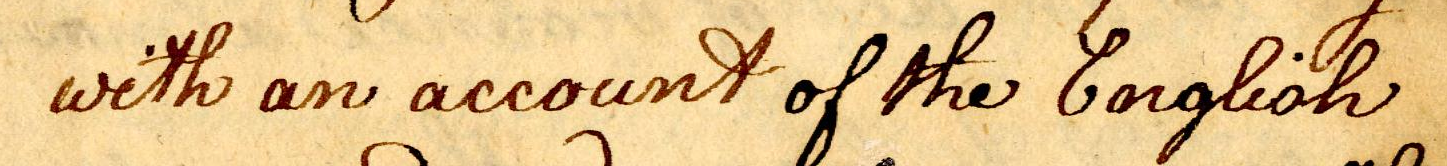with an account of the English
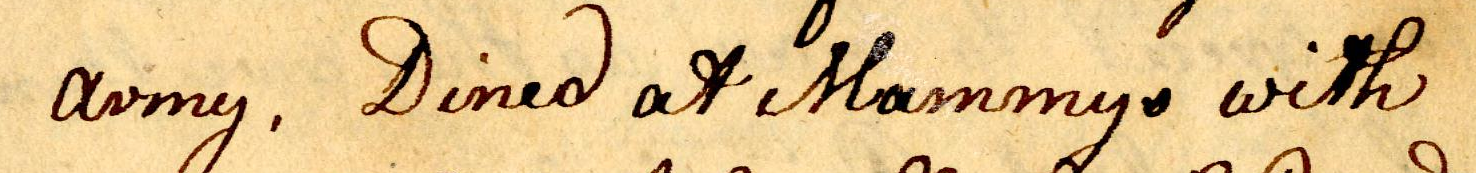Army, Dined at Mammys with
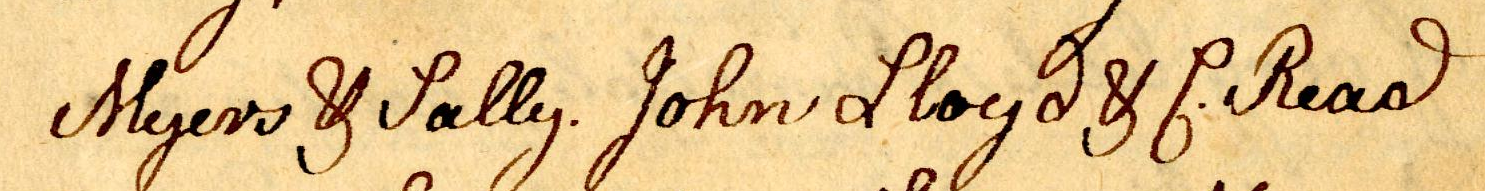Myers & Sally. John Lloyd & C. Read
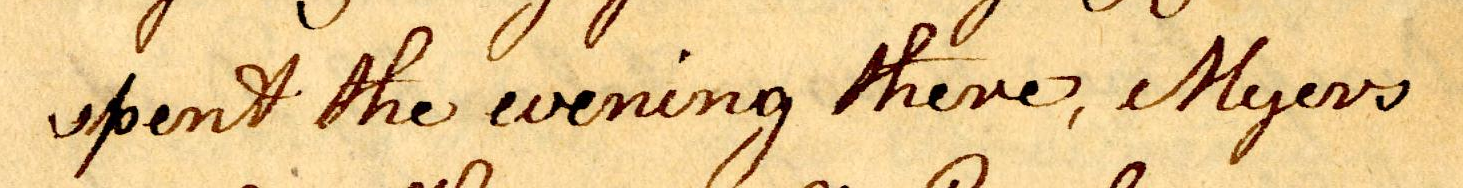spent the evening there, Myers
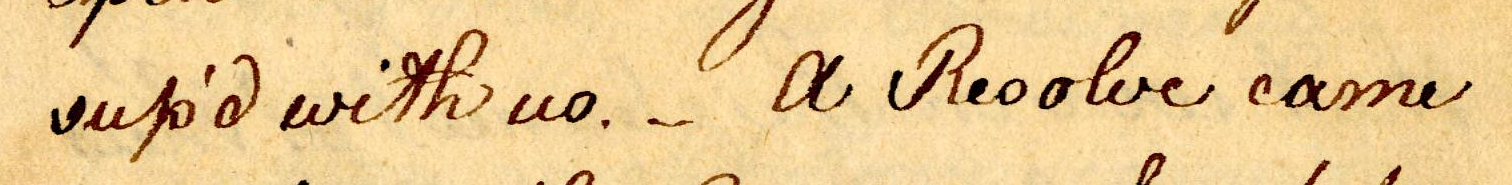sup'd with us.- A Resolve came
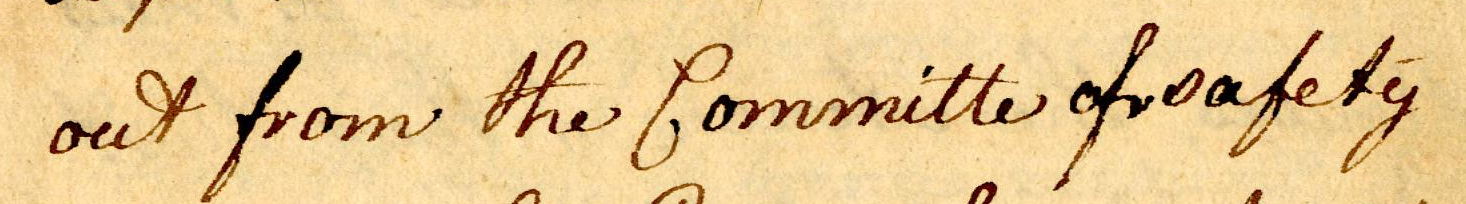out from the Committe of safety
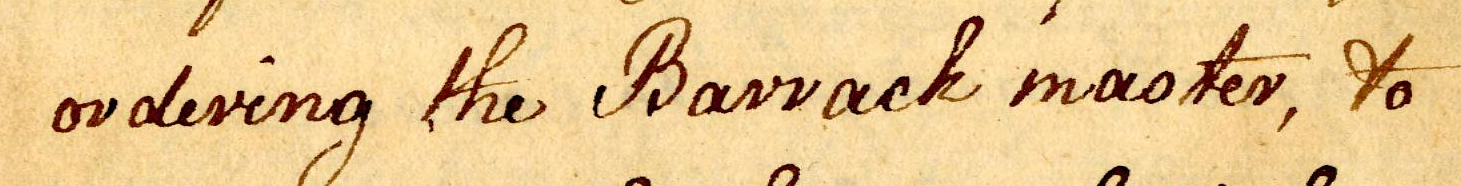ordering the Barrack master, to
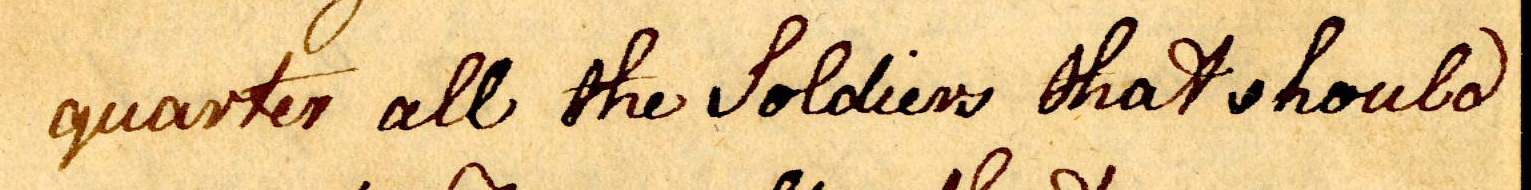quarter all the Soldiers that should
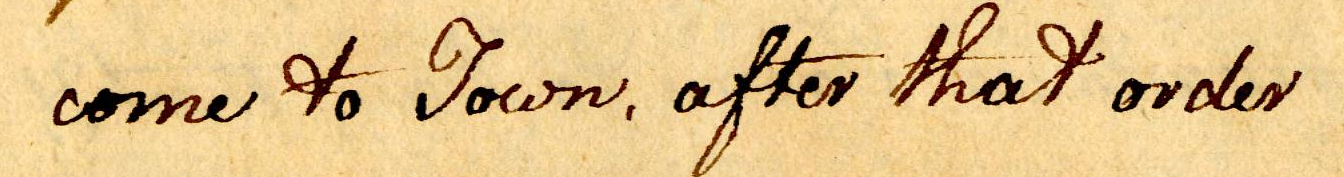come to Town, after that order
